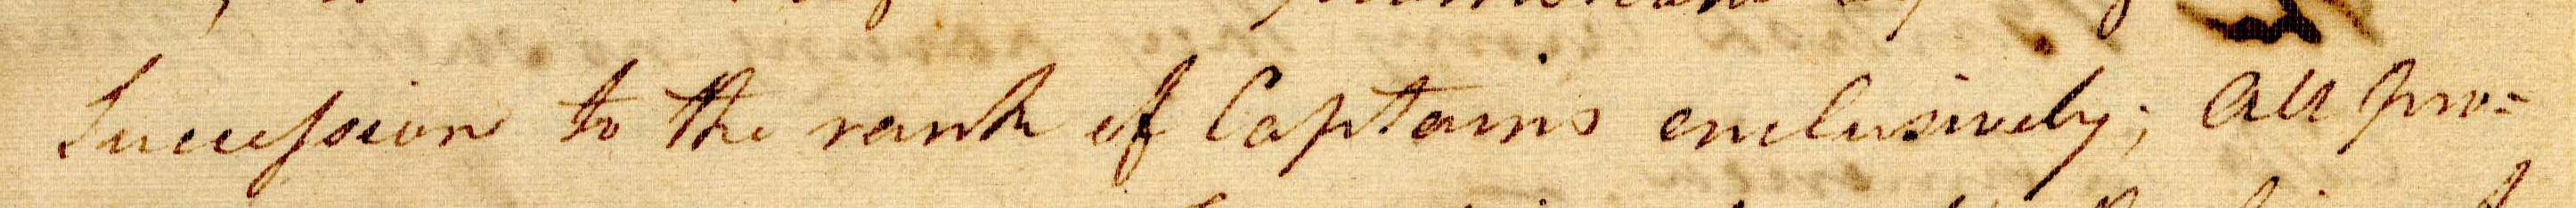Succession to the rank of Captains exclusively; All pro-
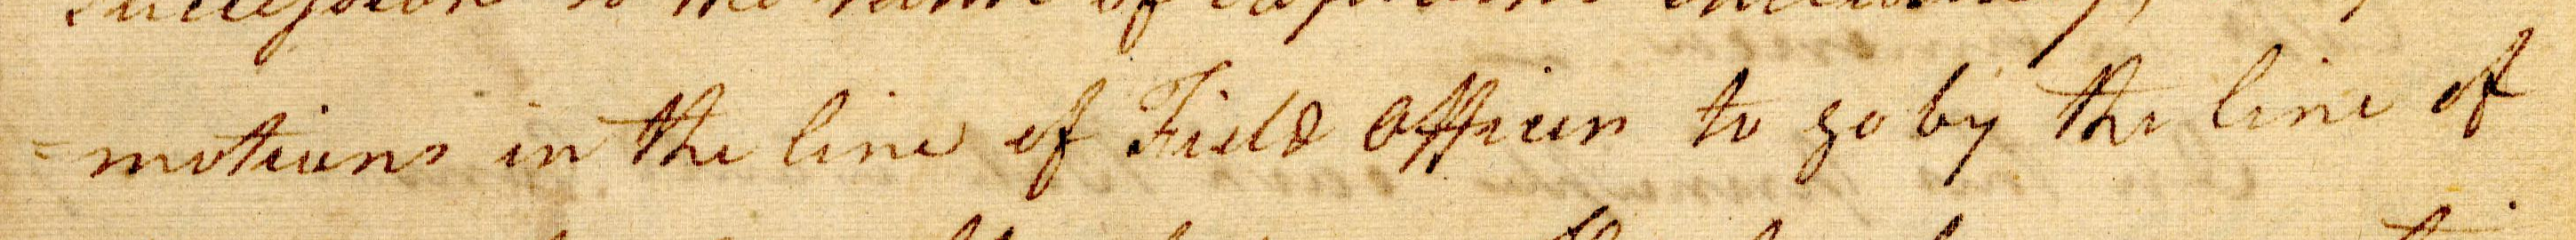-motions in the line of Field Officer to go by the line of
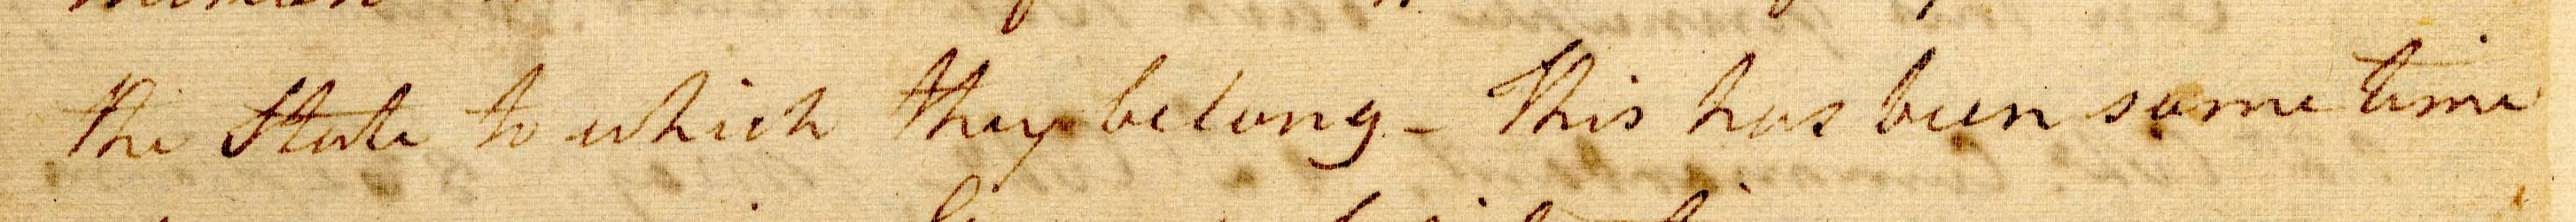the State to which they belong- This has been some time
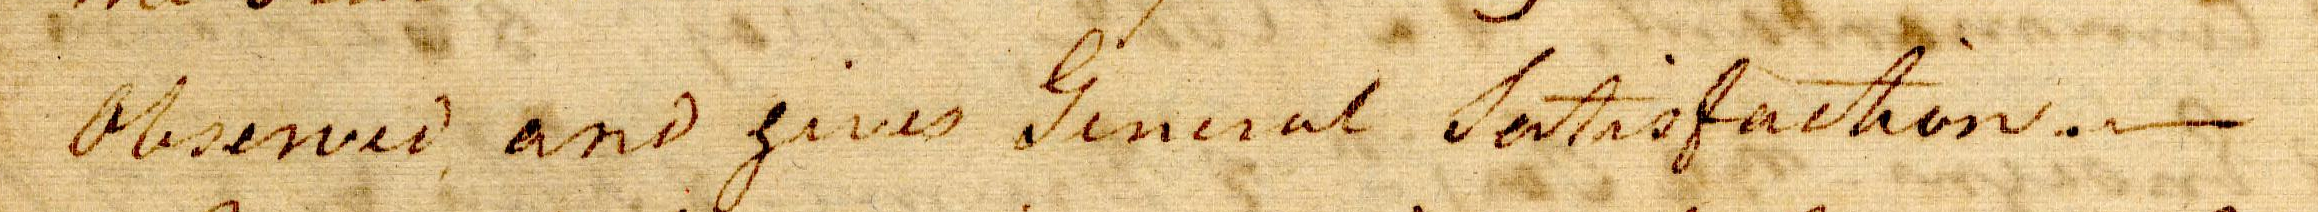observed and gives General Satisfaction.-
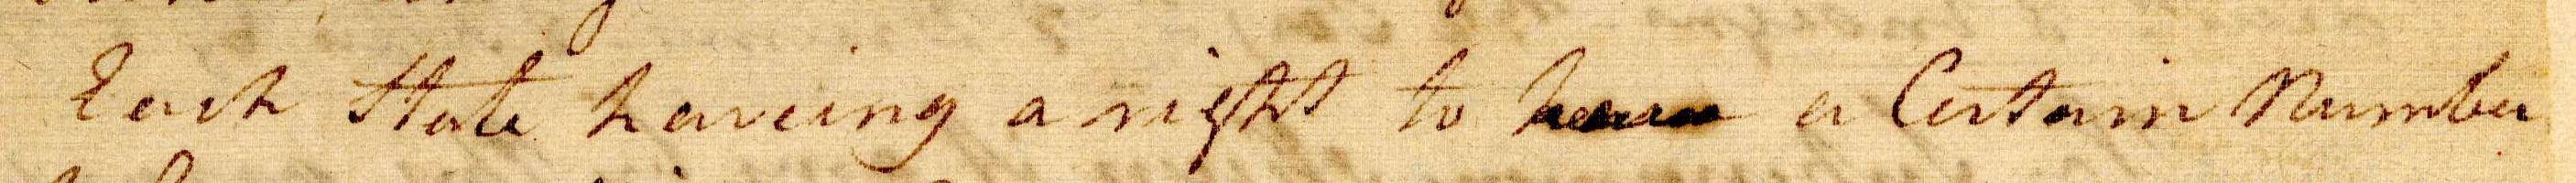Each State having a right to [____] a Certain Number
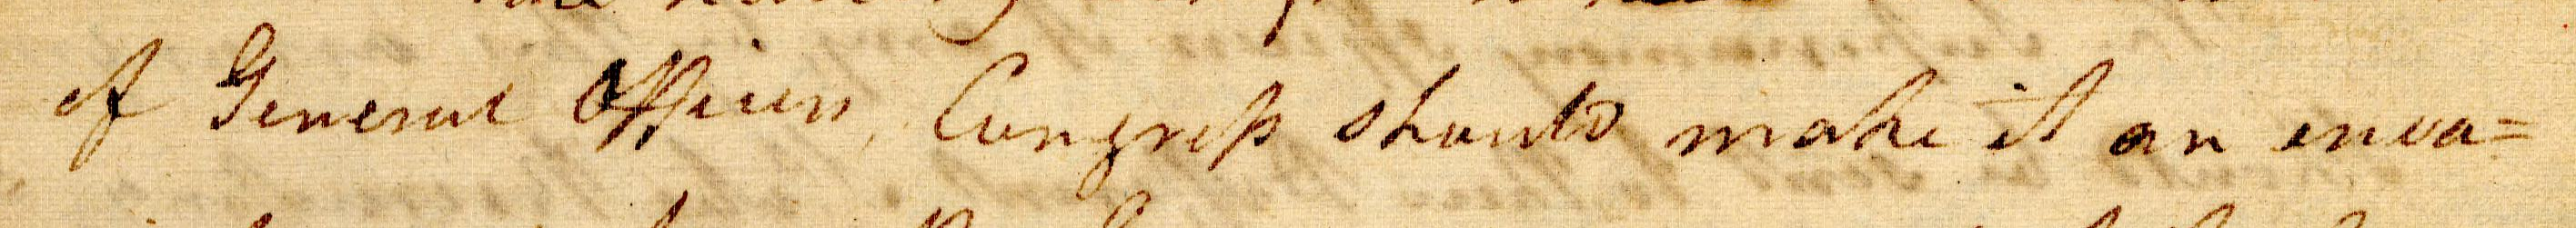of General Officers, Congress should make it an inva-
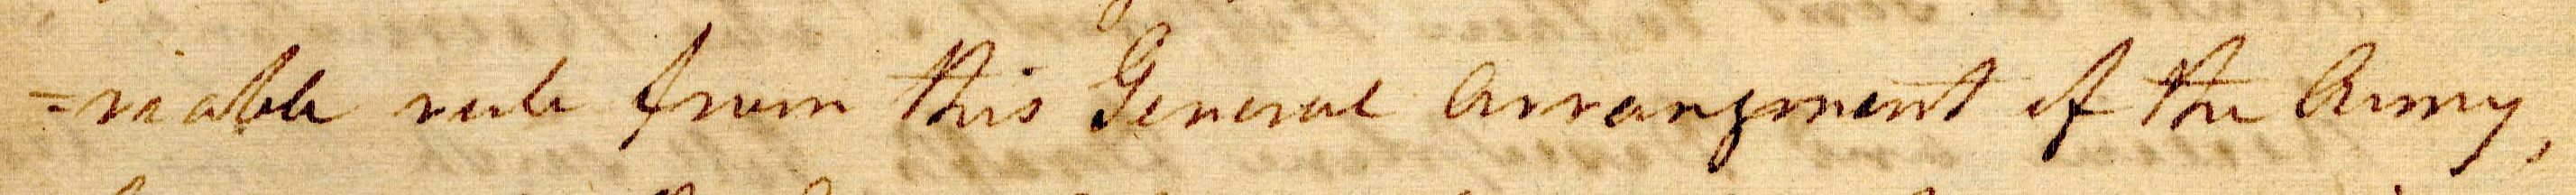-riable rule from this General Arrangement if the Army,
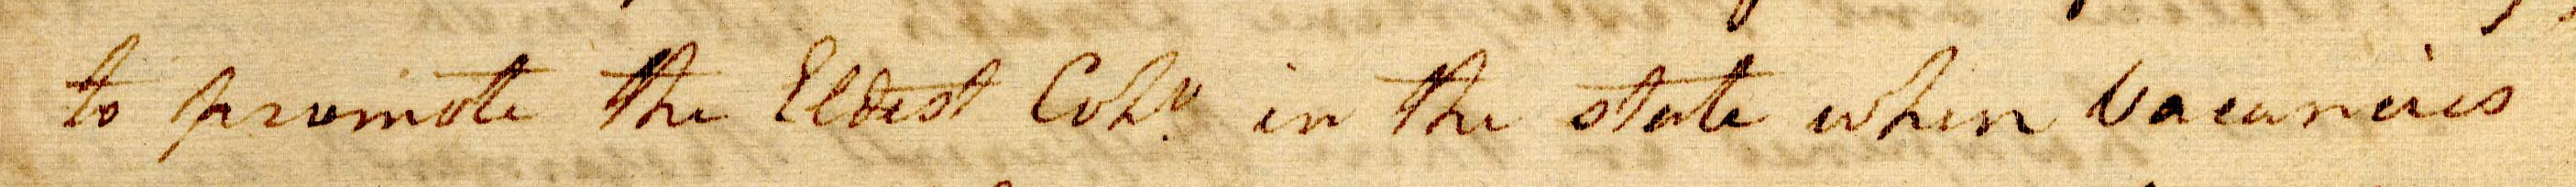to promote the Eldest Col^o. in the state when vacancies
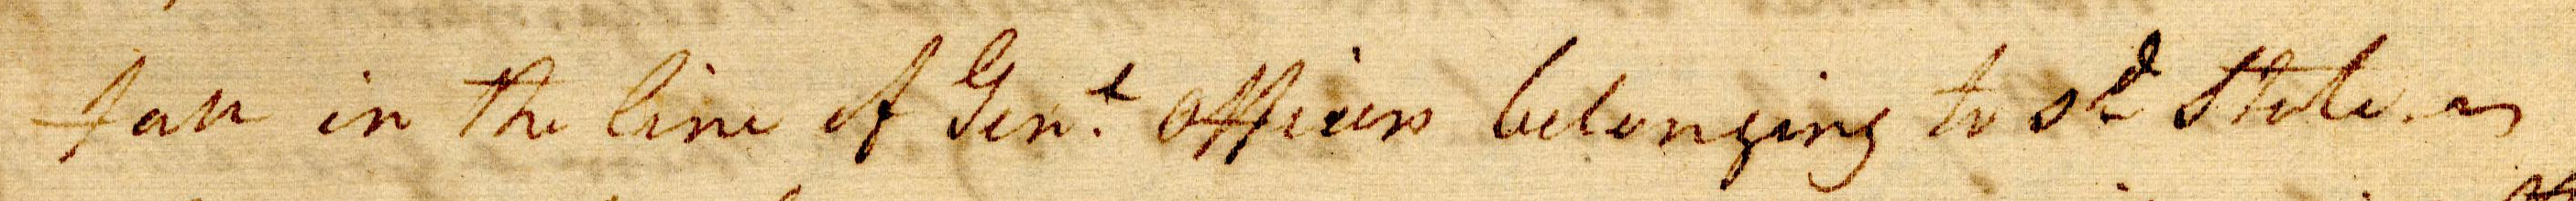fall in the line of Gen^l. Officers belonging to s^d. State-
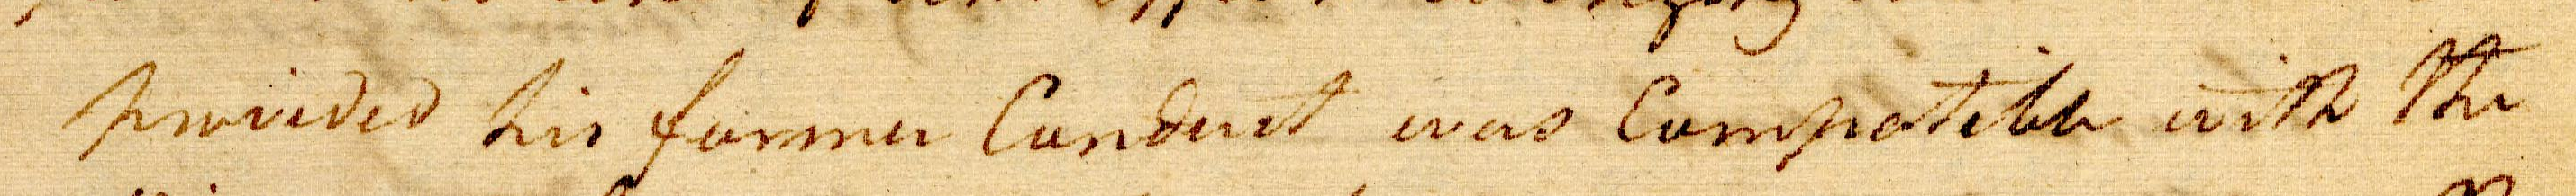provided his former Conduct was Compatible with the
